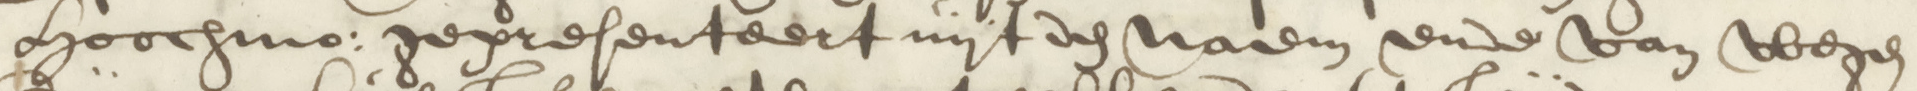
Hoochmo: gepresenteert uijt den naem ende van wegen
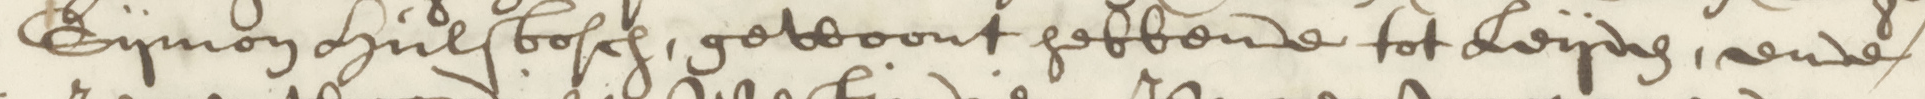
Sijmon Hulsbosch, gewoont hebbende tot Leijden, ende
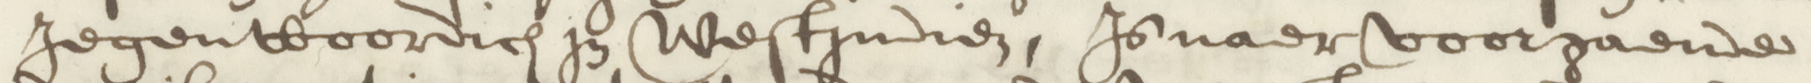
Jegenwoordich in Westindien. Is naer voorgaende
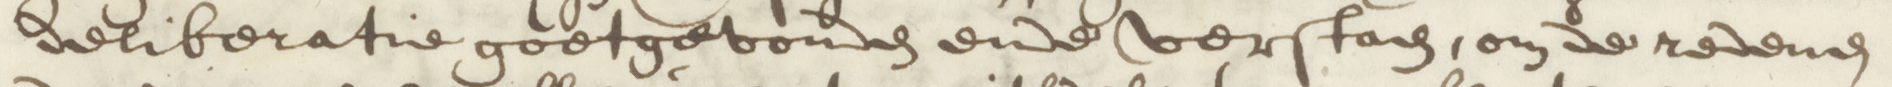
deliberatie goetgevonden ende verstaen, om de redenen
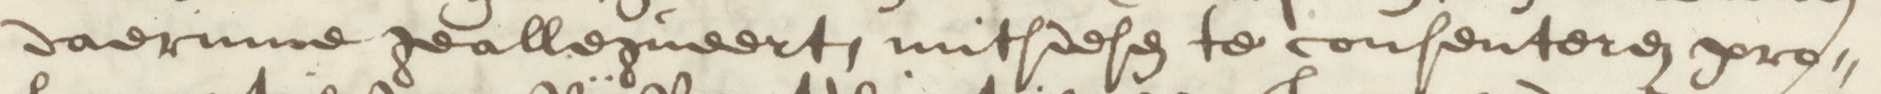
daerinne geallegueert, mitsdesen te consenteren pro„
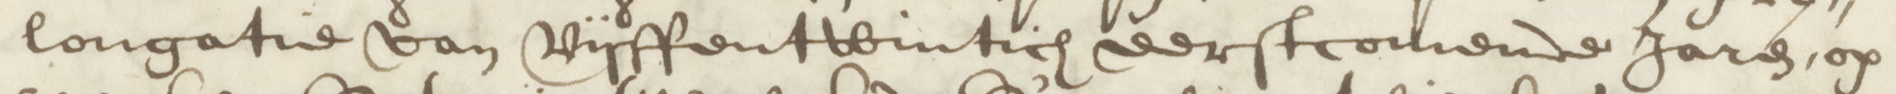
longatie van vijffentwintich eerstcomende Jaren, op
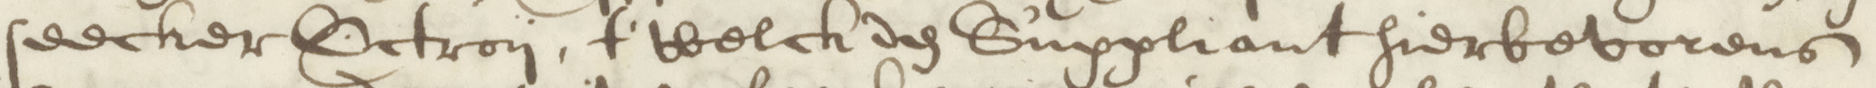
seecker Octroij, t'welck den Suppliant hierbevorens
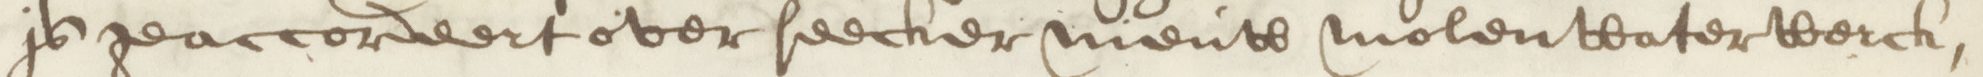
is geaccordeert over seecker nieuw molenwaterwerck,
